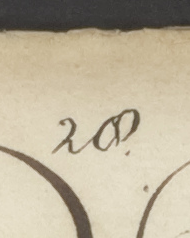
28.
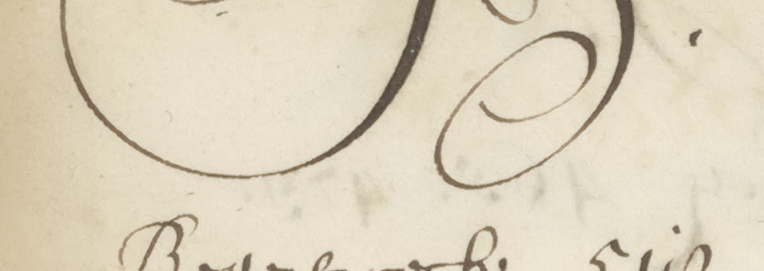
B
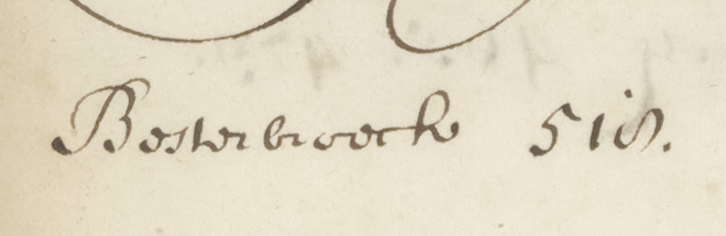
Besterbroeck, 518.
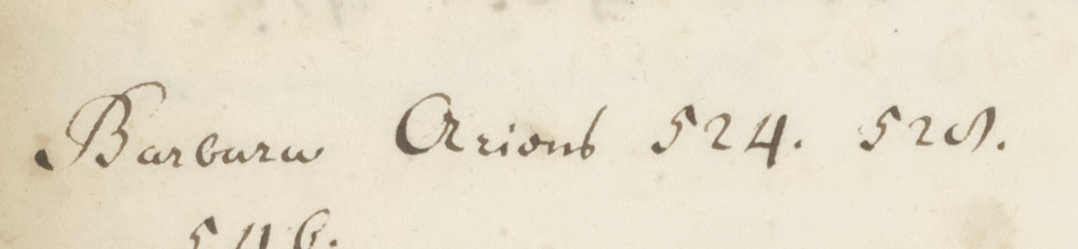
Barbara Ariens 524, 528.
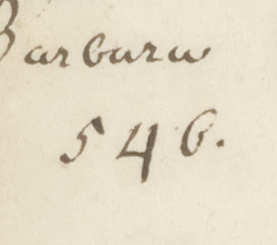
546.
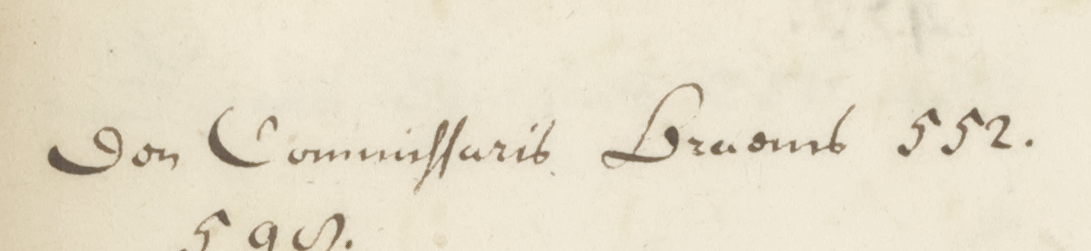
Den Commissaris Braems 552.
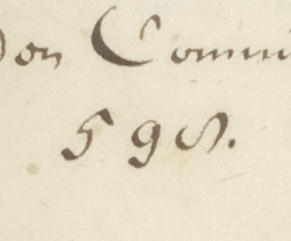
598
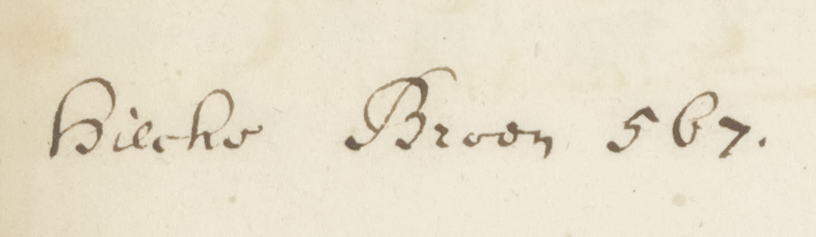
Hilcke Broen 567.
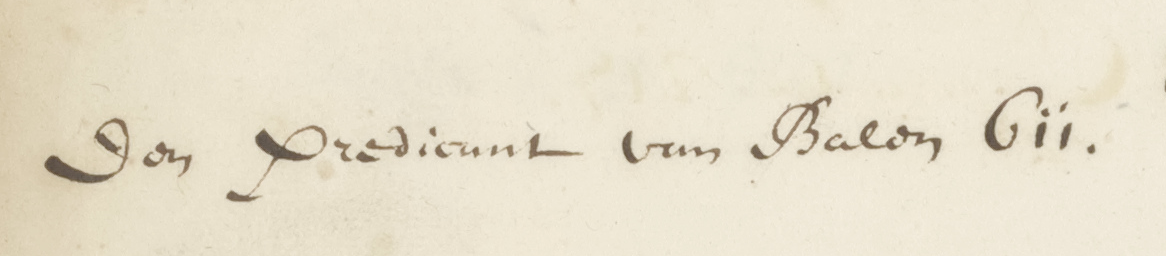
Den Predicant van Balen 611.
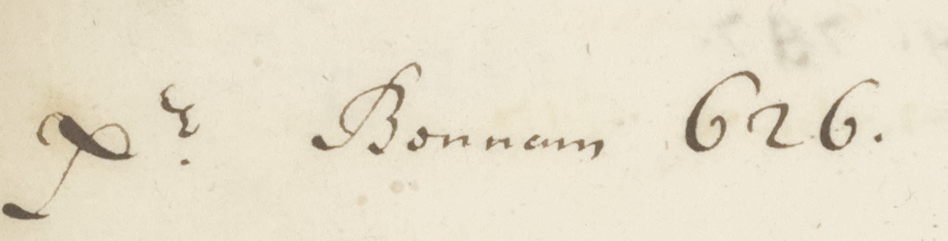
Pr. Bonnam 626.
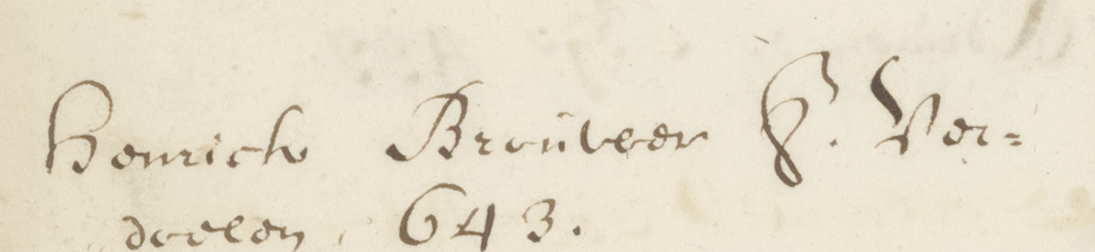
Henrick Brouwer ca. Ver,,
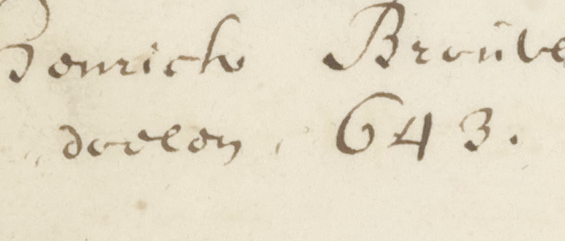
doelen, 643.
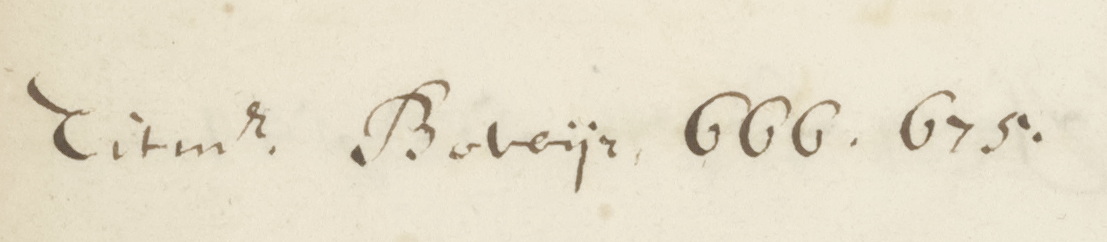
ritmr. Bowijr, 666, 675.
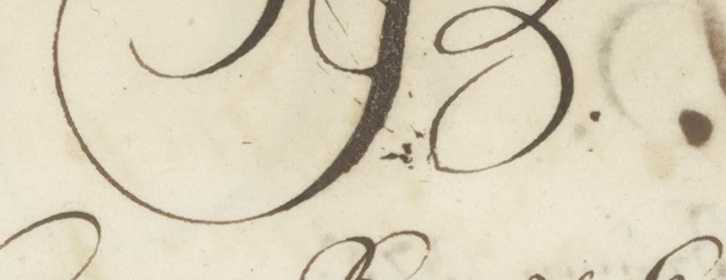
B
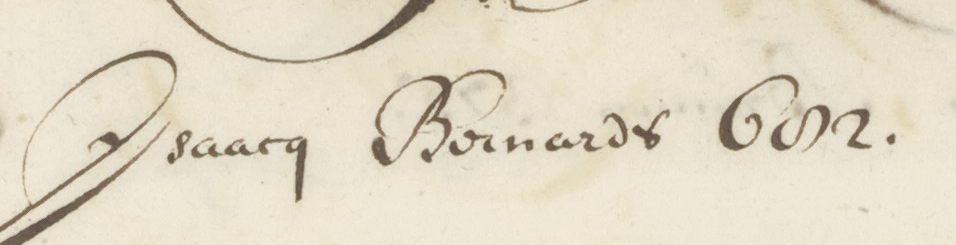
Isaacq Bernards 682.
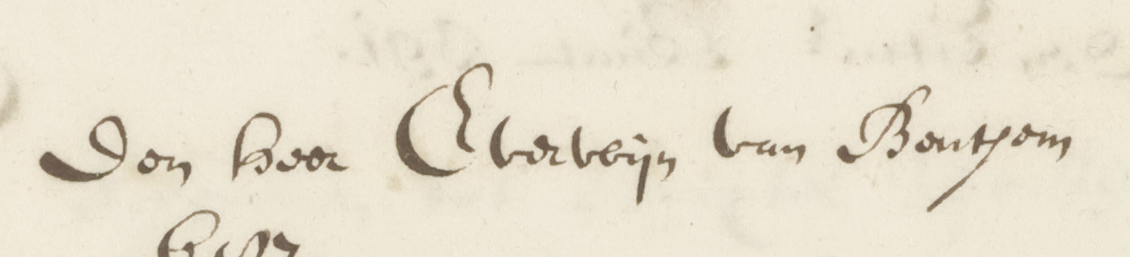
Den heer Everwyn van Benthem
